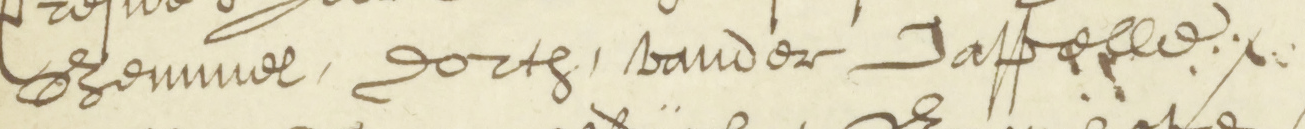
Bemmel, Dorth, vander Cappelle,
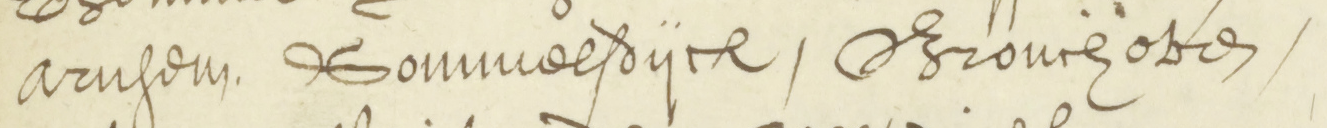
Arnhem, Sommelsdijck, Brouchoven,
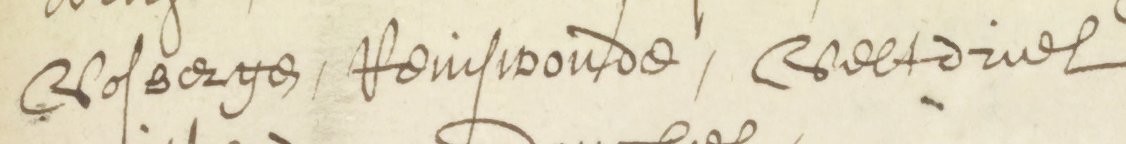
Vosbergen, Reinswoude, Veltdriel,
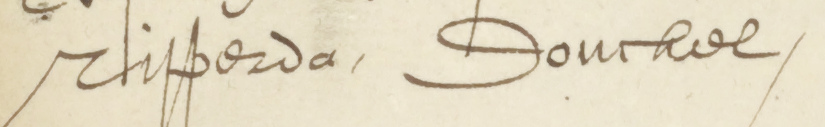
Ripperda, Donckel.
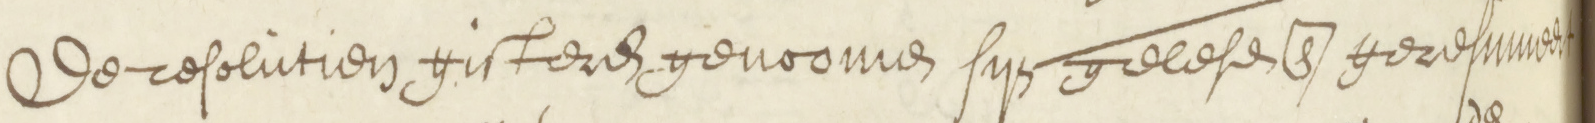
De resolutien gisteren genoomen syn gelesen & geresume
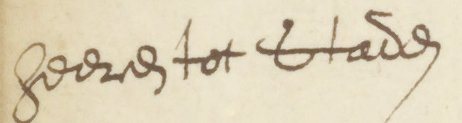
heeren tot Staden
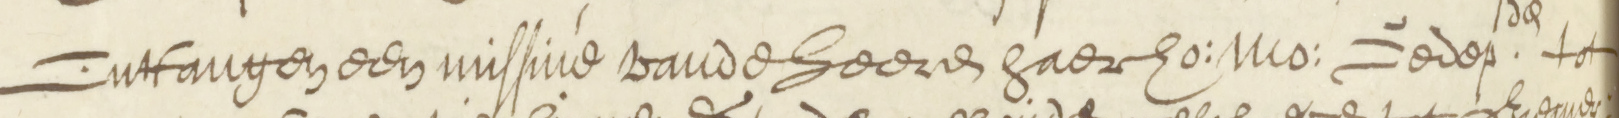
Ontfangen een missiue vande heeren haer ho:Mo: Gedepden. tot
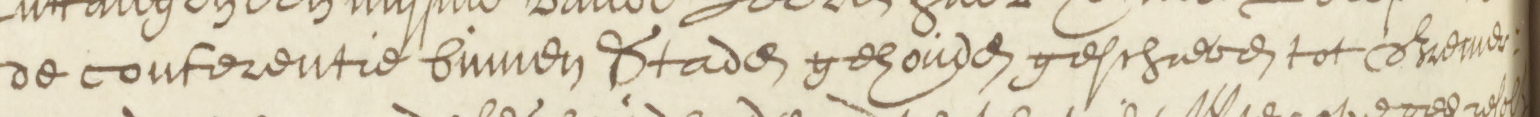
de conferentie binnen Staden gehouden geschreven tot Bremen
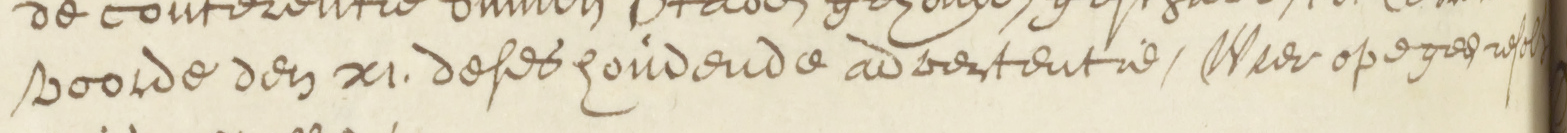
voorde den xi. deses houdende advertentie. Waer op egeen resol
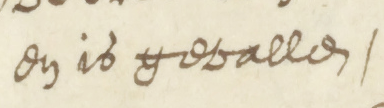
en is gevallen.
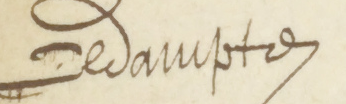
Oldampten
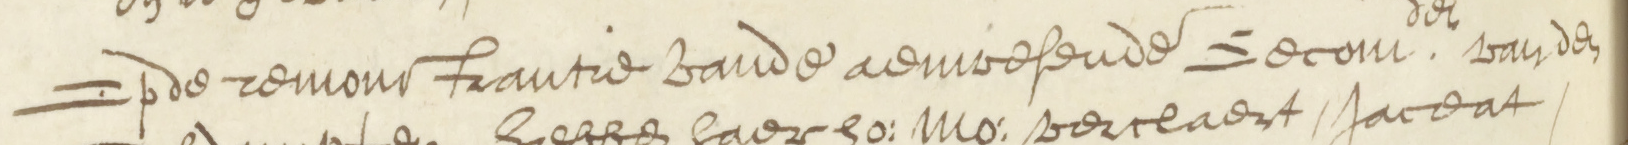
Opde remonstrantie vande aenwesende Gecomden. van den
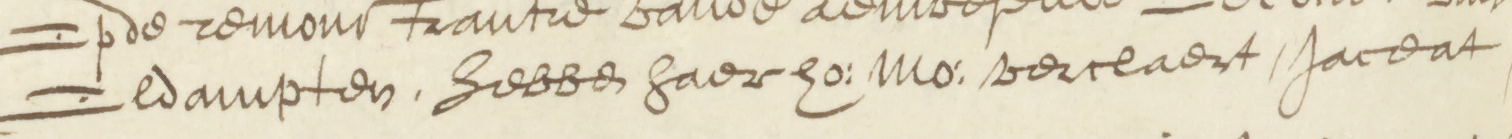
Oldampten, hebben haer ho:Mo: verclaert, Jaceat
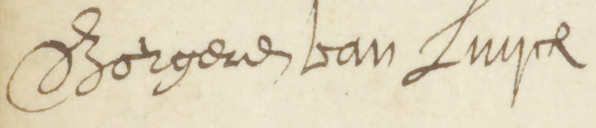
Borgeren van Luyck
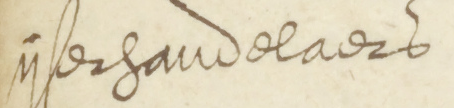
ijserhandelaers
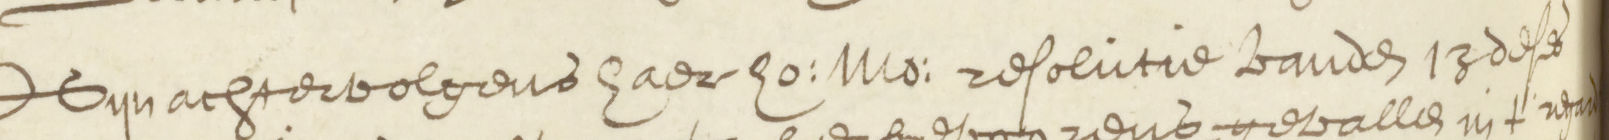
Sijn achtervolgens haer ho:Mo: resolutie vanden 13 deses
